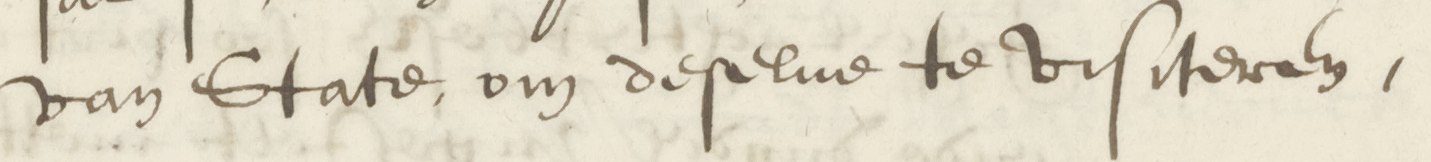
van State, om deselve te visiteren.
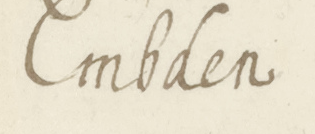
Embden
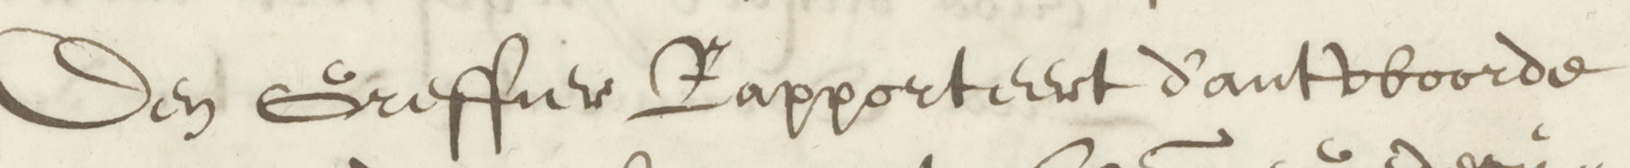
Den Greffier rapporteert d'antwoorde
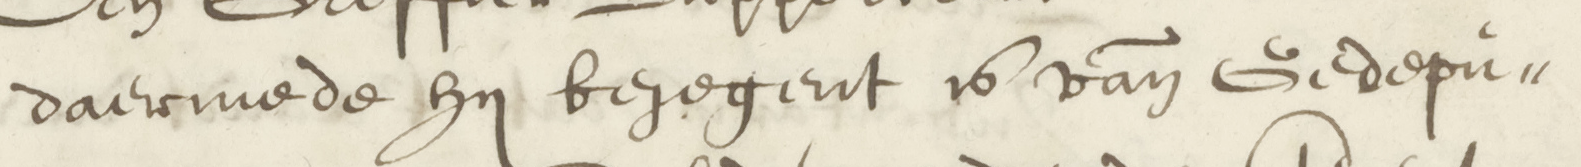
daermede hy bejegent is van Gedepu„
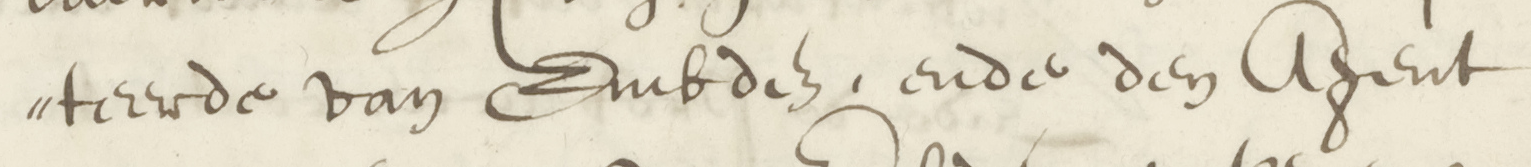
,,teerde van Embden, ende den Agent
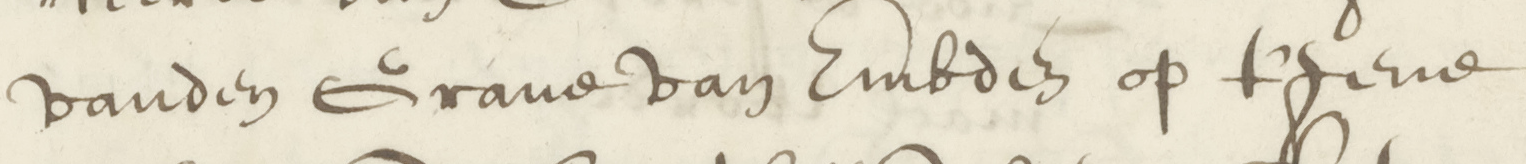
vanden Graue van Embden op t'gene
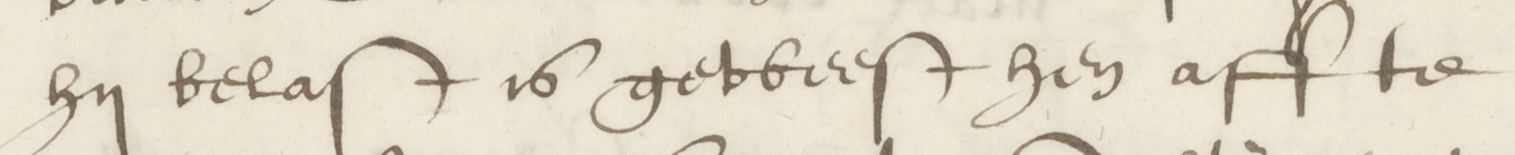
hy belast is geweest hen aff te
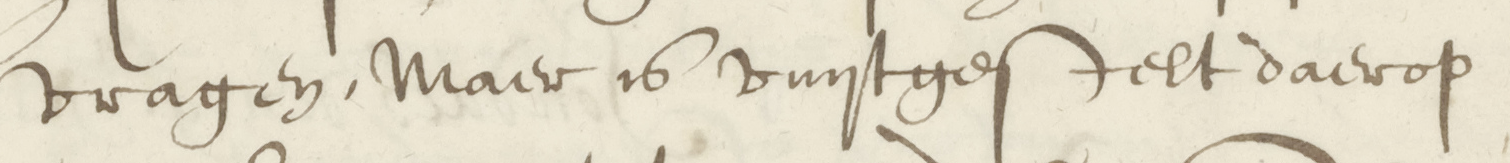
vragen, maer is uuytgestelt daerop
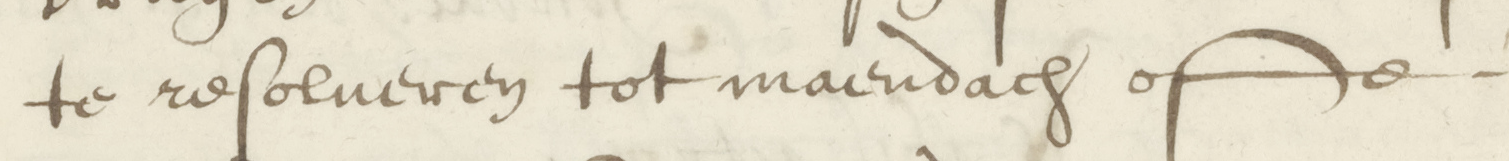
te resolueren tot maendach ofte
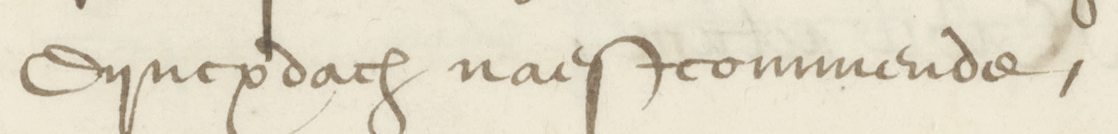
dyncxdach naestcommende.
